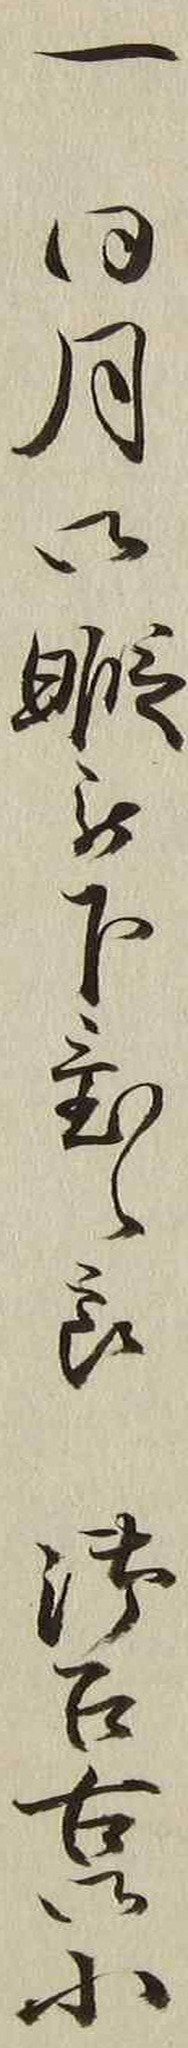一同月御暇被下置候節御召古御小
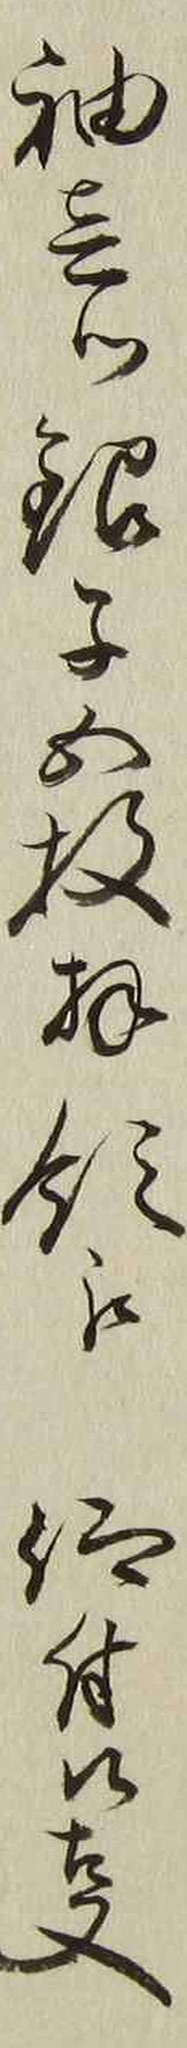袖壱ツ銀子五枚拝領被仰付候事
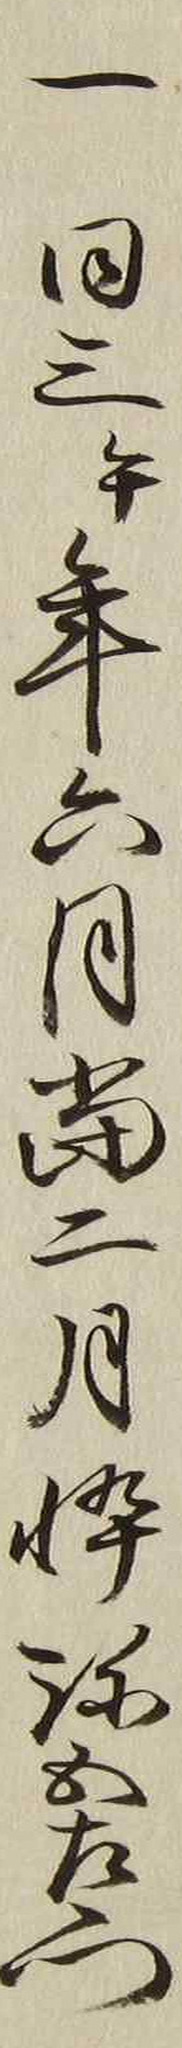一同三午年六月当二月忰弥五左衛門
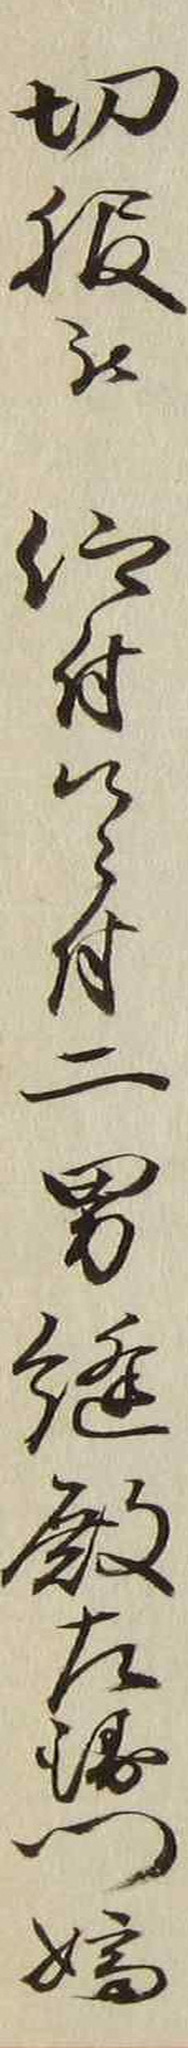切服被仰付候ニ付二男縫殿左衛門嫡
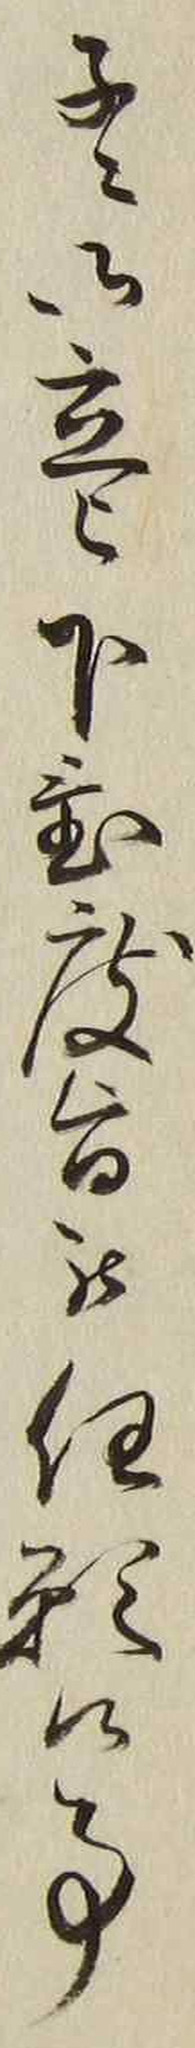子ニ御立被下置度旨被任願候事
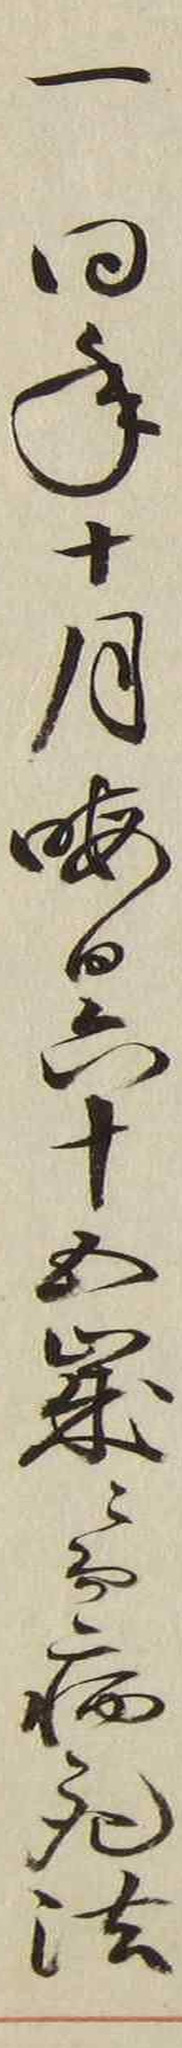一同年十月晦日六十五歳ニ而病死法

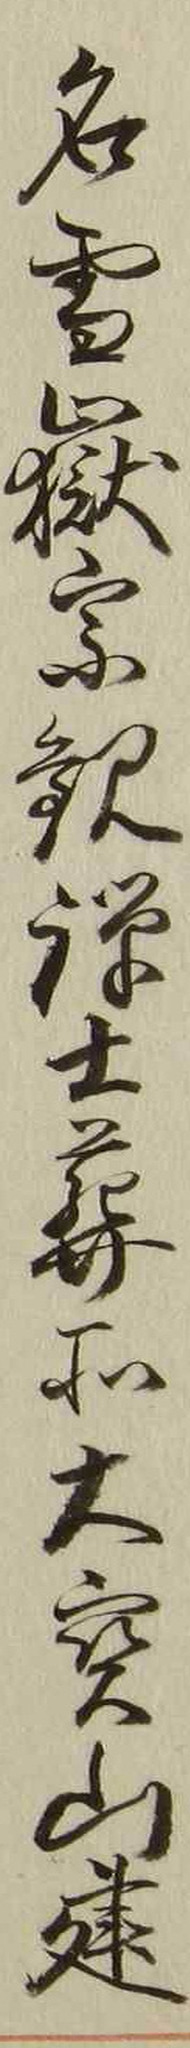名雪嶽宗観禅士葬所大宝山建
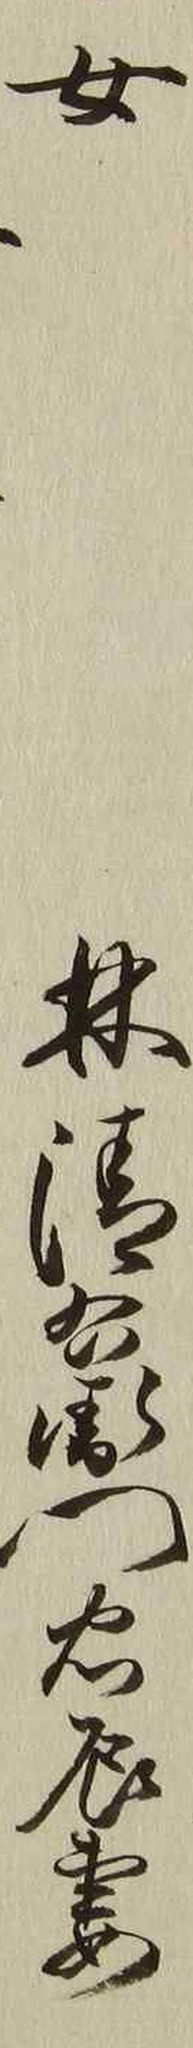女林清右衛門忠辰妻
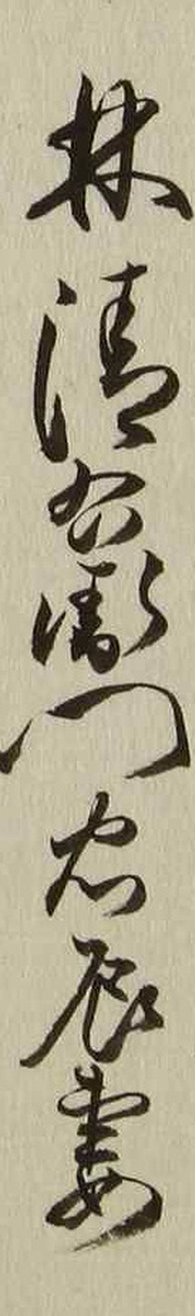女林清右衛門忠辰妻
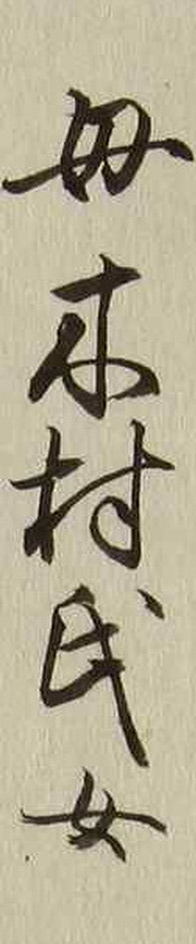母木村氏女
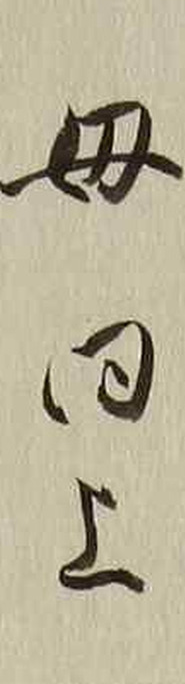母同上
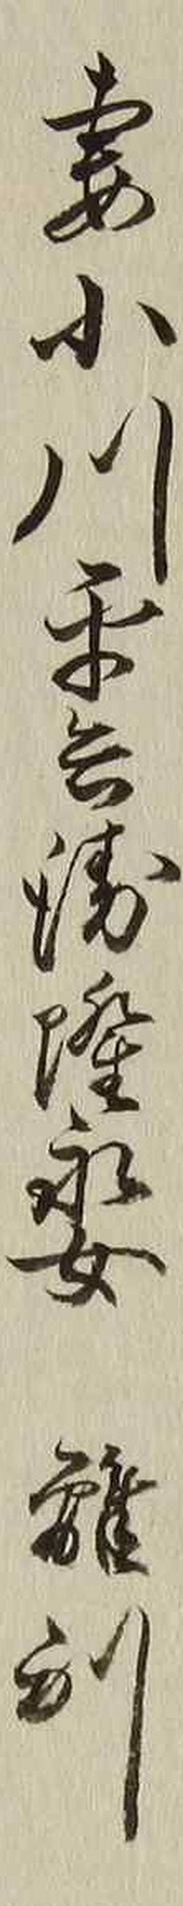妻小川平兵衛隆永女離別
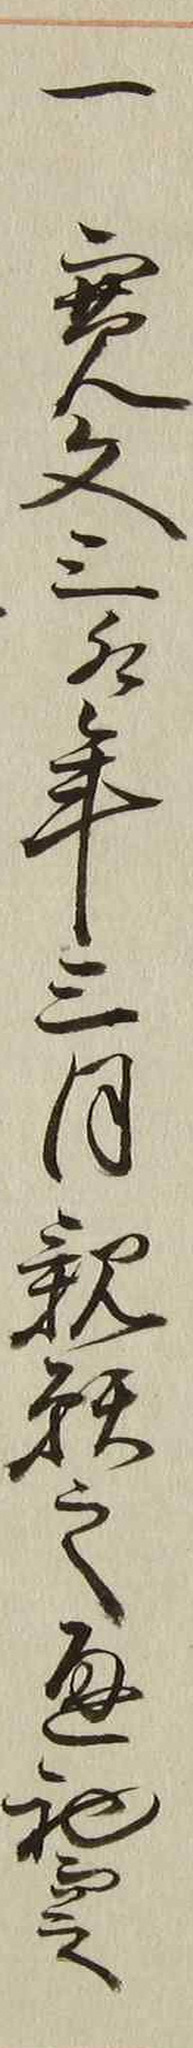一寛文三卯年三月親願之通初而之
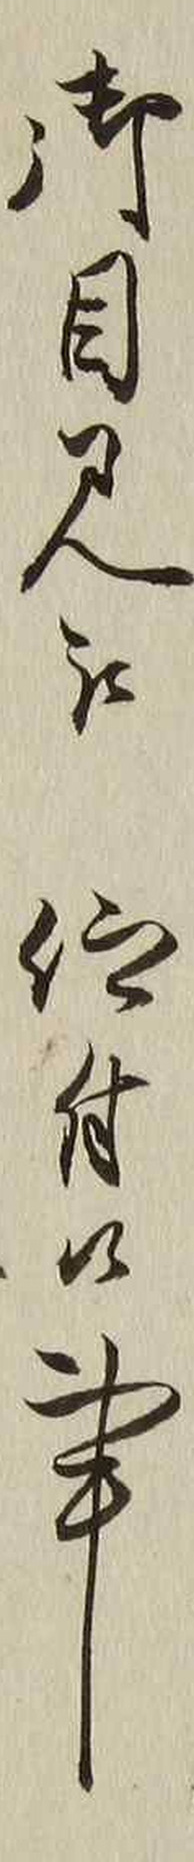御目見被仰付候事
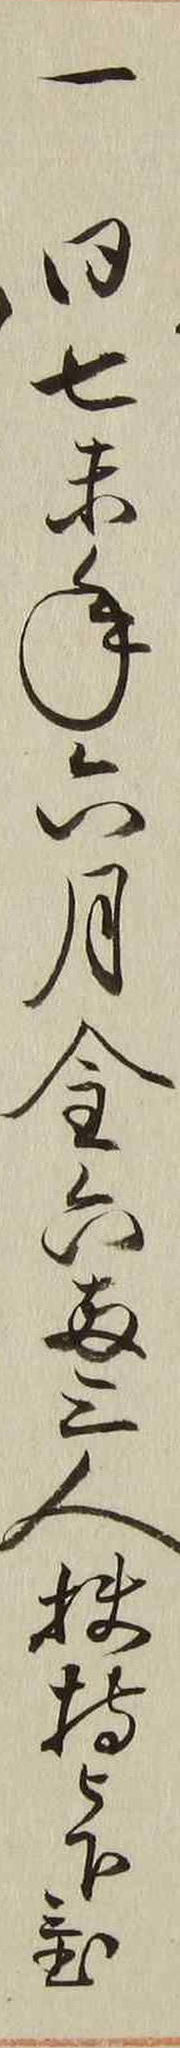一同七未年六月金六両三人扶持被下置
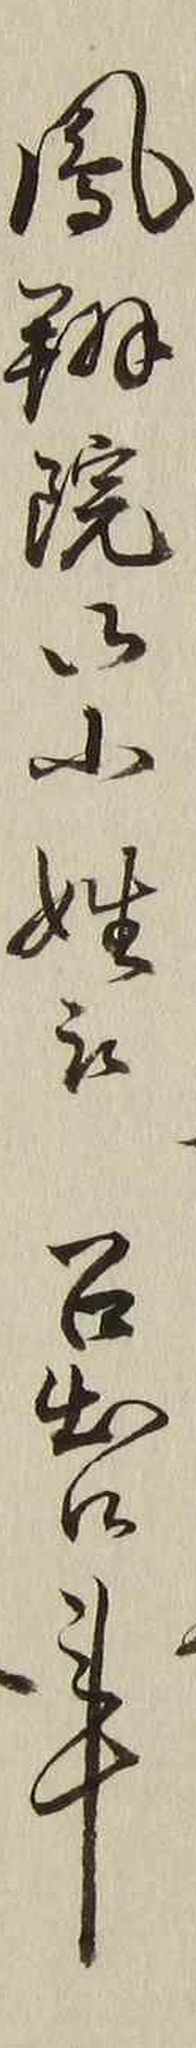鳳翔院御小姓被召出候事
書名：諸士系譜　巻之60　と之部3
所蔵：会津若松市立会津図書館
